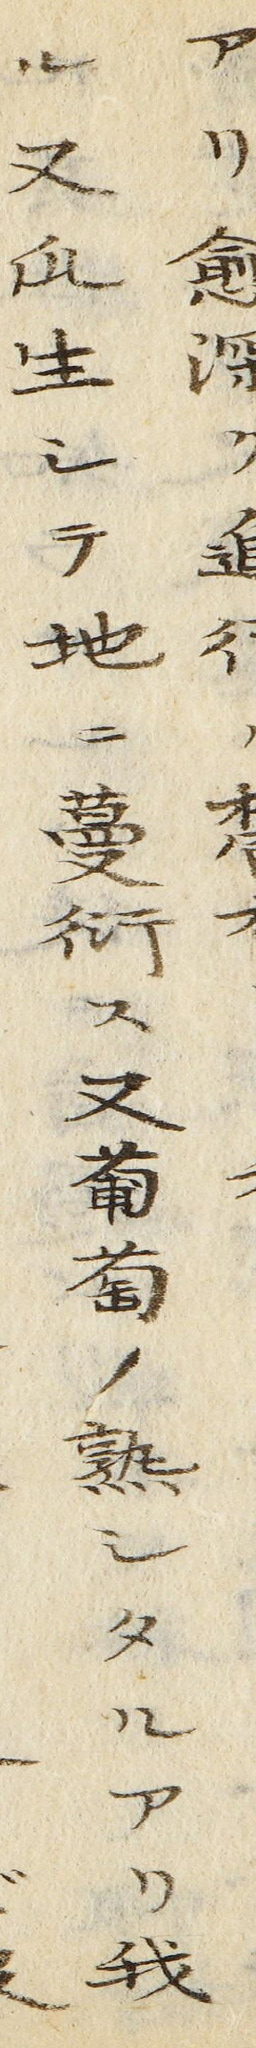ル又瓜生シテ地ニ蔓衍ス又葡萄ノ熟シタルアリ我
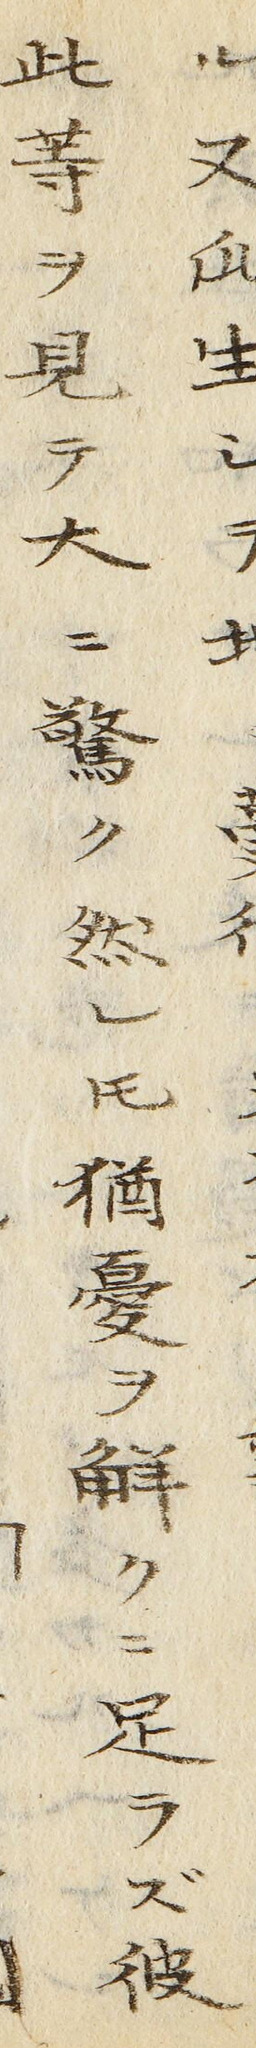此等ヲ見テ大ニ驚ク然レトモ猶憂ヲ解クニ足ラズ彼
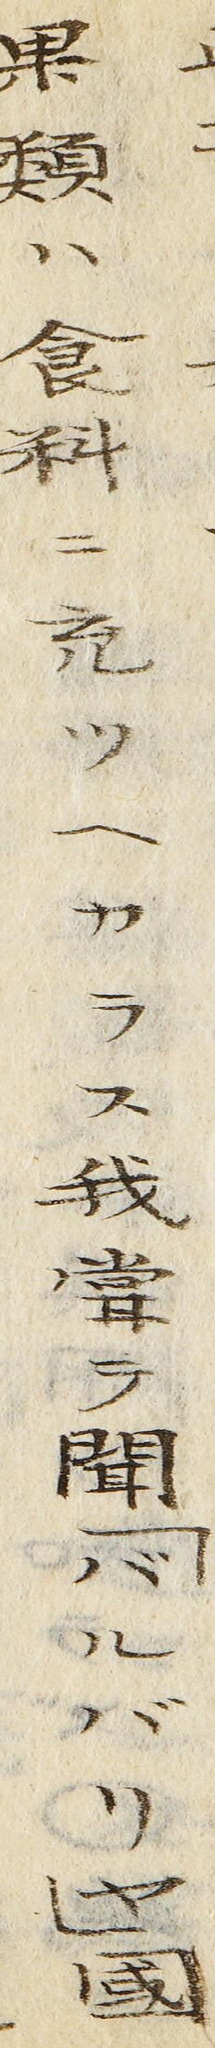果類ハ食料ニ充ツヘカラス我嘗テ聞「バルバリヤ」国
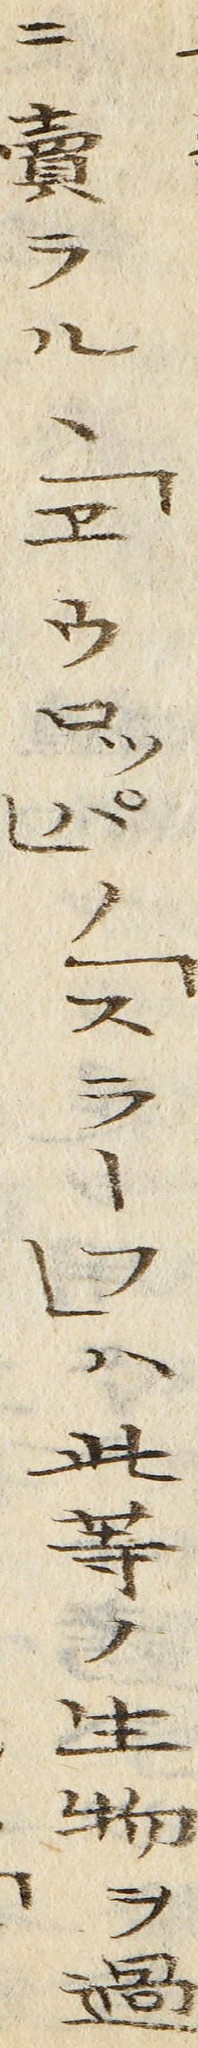ニ売ラルヽ「ヱウロツパ」ノ「スラーフ」ハ此等ノ生物ヲ過
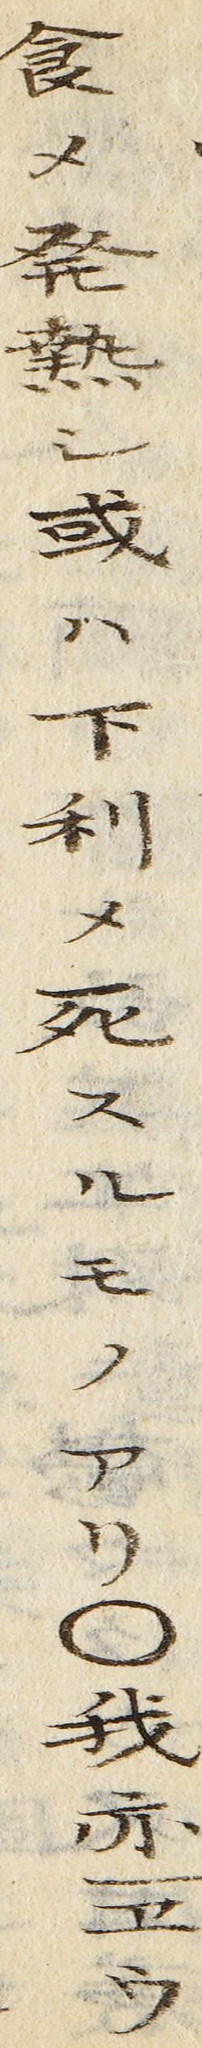食シテ発熱シ或ハ下利シテ死スルモノアリ◯我亦「ヱウ
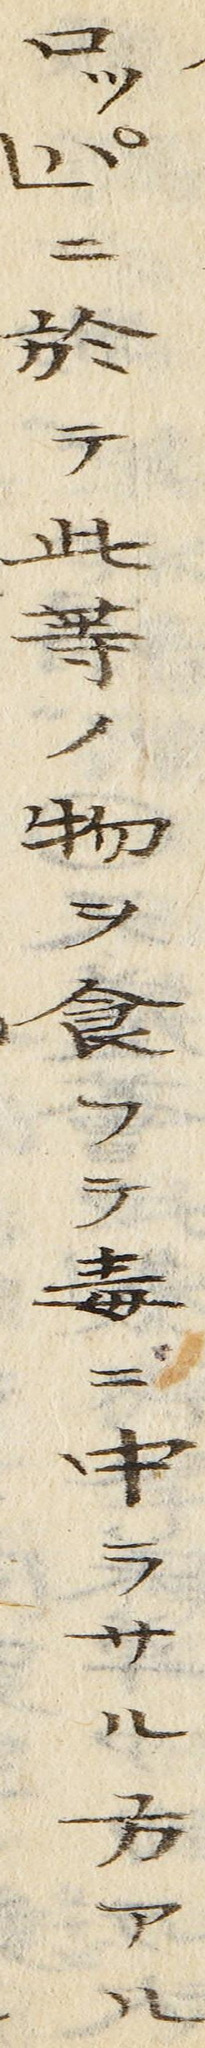ロツパ」ニ於テ此等ノ物ヲ食フテ毒ニ中ラサル方アル
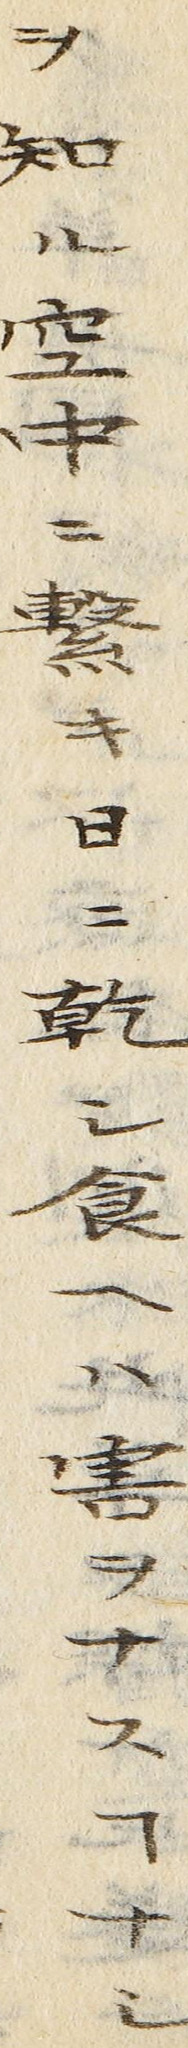ヲ知ル空中ニ繋キ日ニ乾シ食ヘハ害ヲナスコトナシ
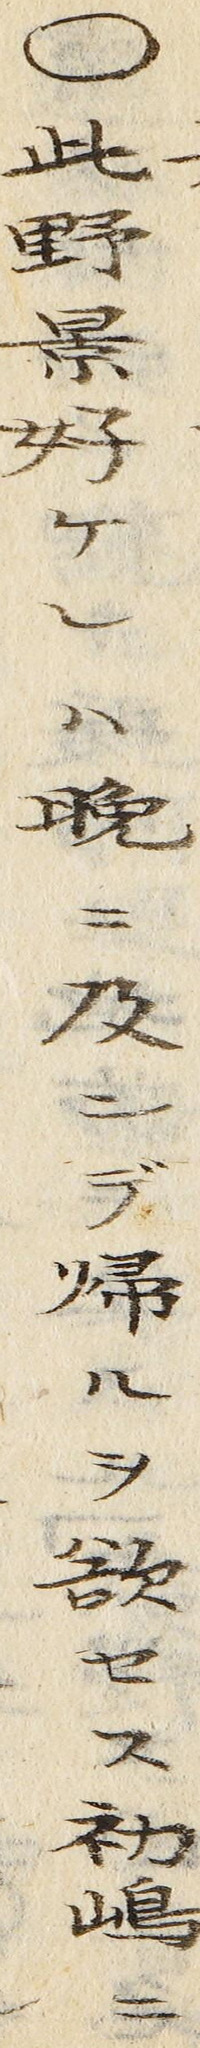◯此野景好ケレハ晩ニ及ンデ帰ルヲ欲セス初島ニ
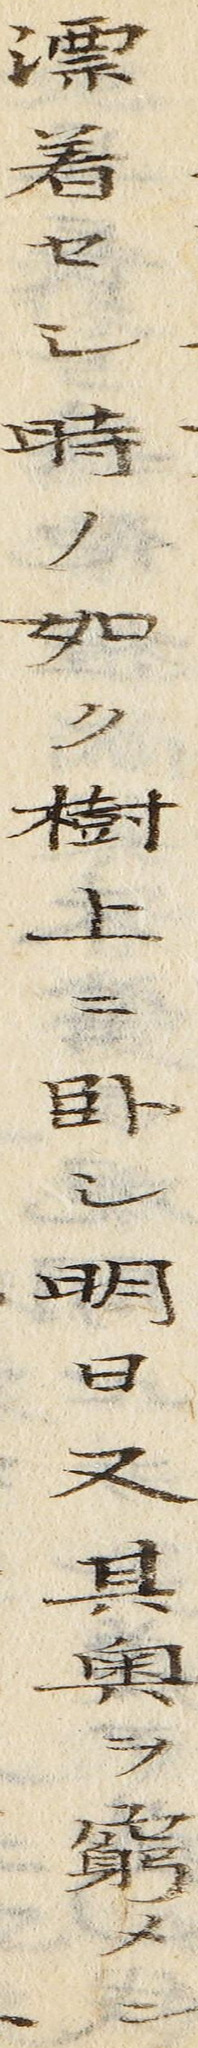漂着セシ時ノ如ク樹上ニ臥シ明日又其奥ヲ窮メン
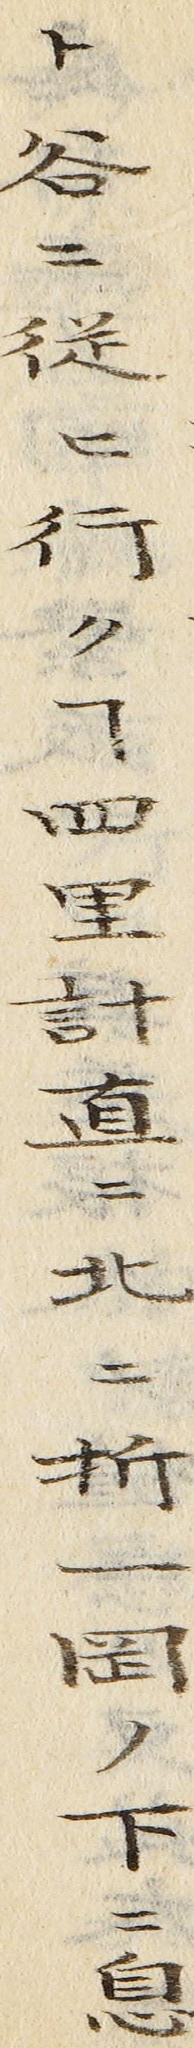ト谷ニ従ヒ行クコト四里計直ニ北ニ折一岡ノ下ニ息
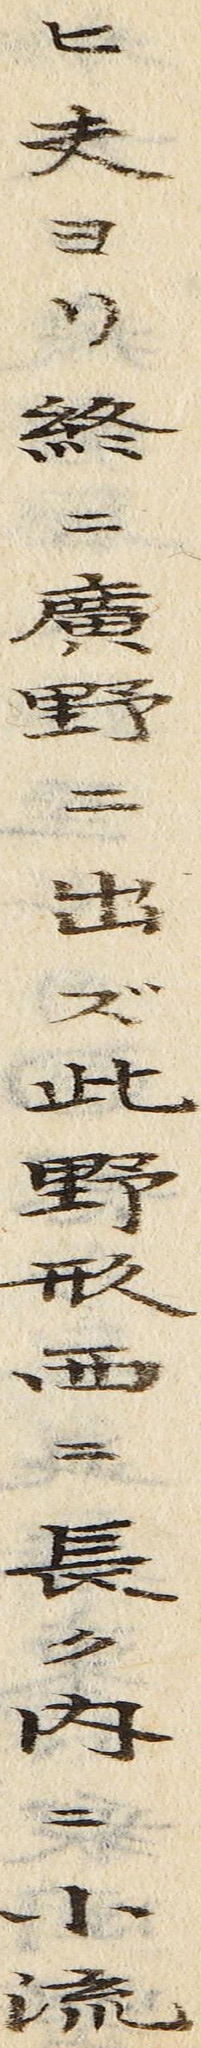ヒ夫ヨリ終ニ広野ニ出ズ此野形西ニ長ク内ニ小流
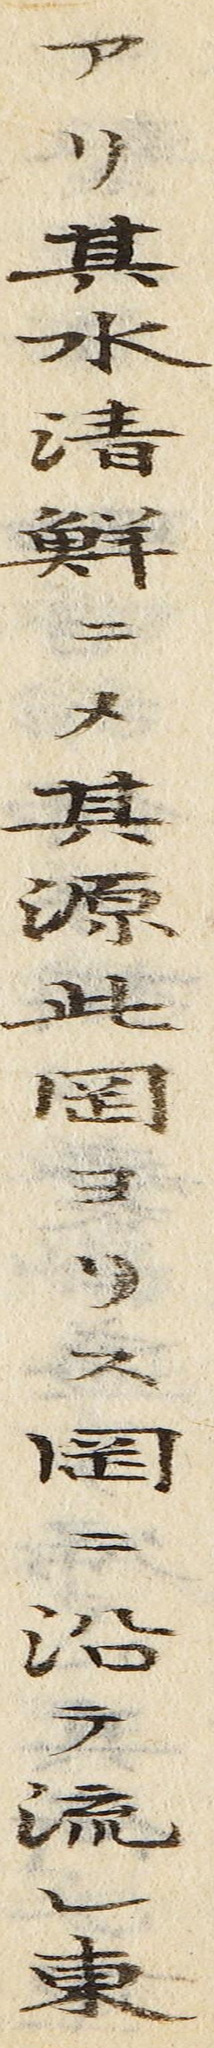アリ其水清鮮ニシテ其源此岡ヨリス岡ニ沿テ流レ東
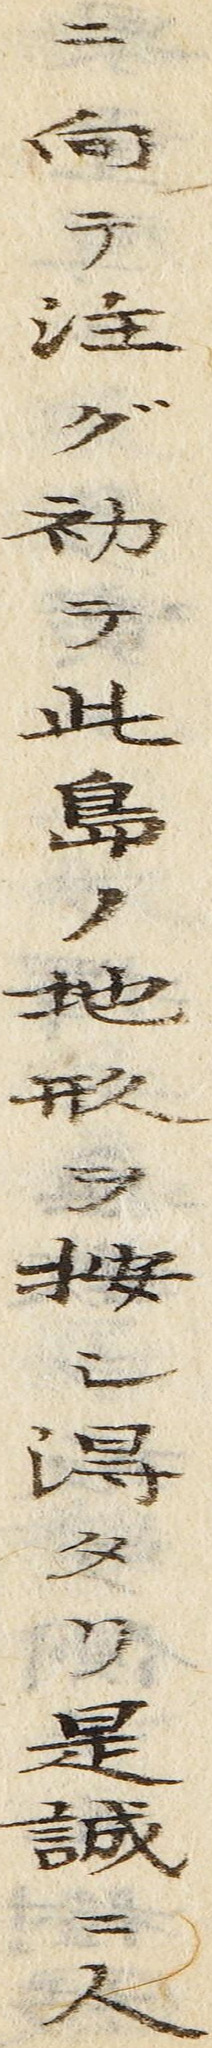ニ向テ注グ初テ此島ノ地形ヲ按シ得タリ是誠ニ人
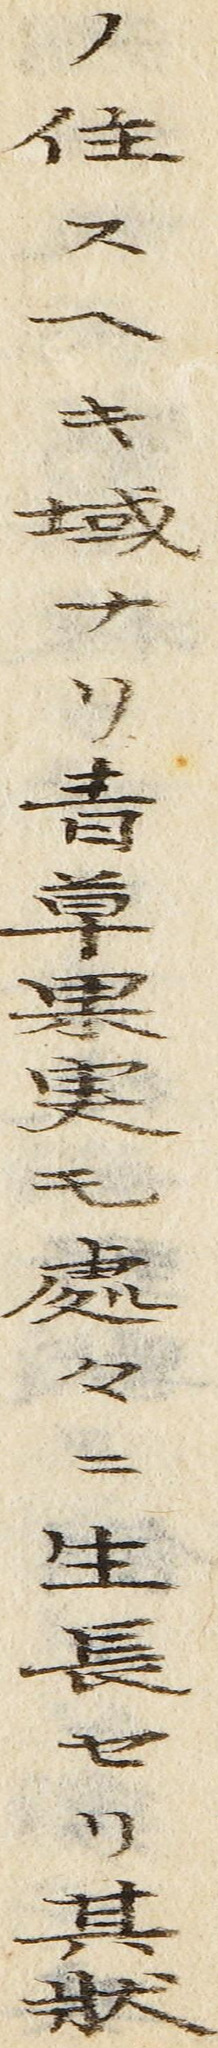ノ住スヘキ域ナリ青草果実モ処々ニ生長セリ其状
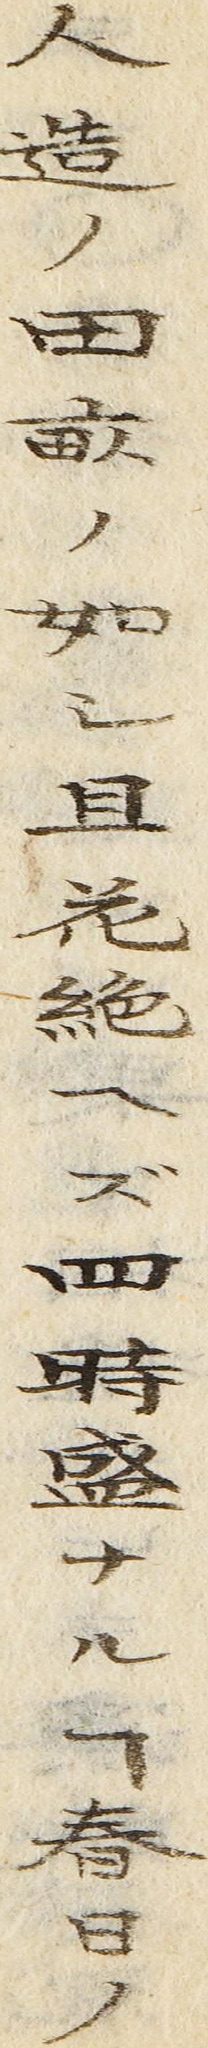人造ノ田畝ノ如シ且花絶ヘズ四時盛ナルコト春日ノ
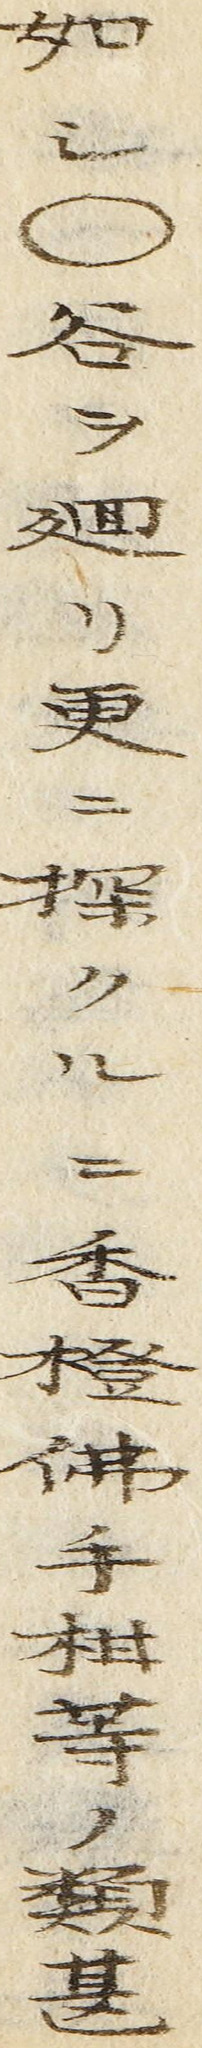如シ◯谷ヲ廻リ更ニ探クルニ香橙仏手柑等ノ類甚
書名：漂流紀事
